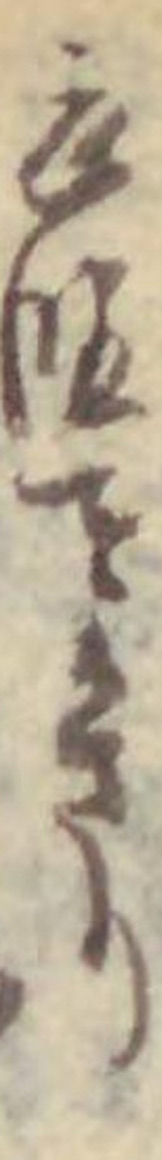衣服をかさり
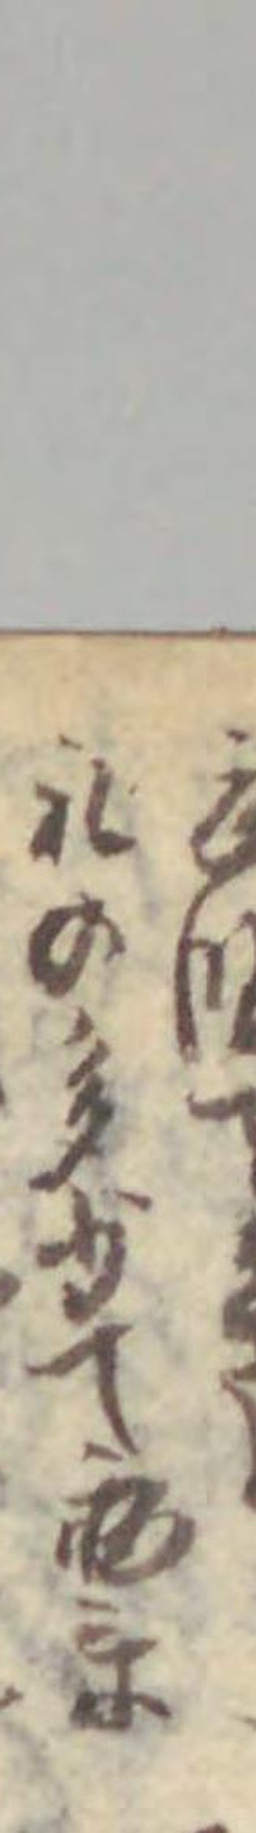礼の多少て病気
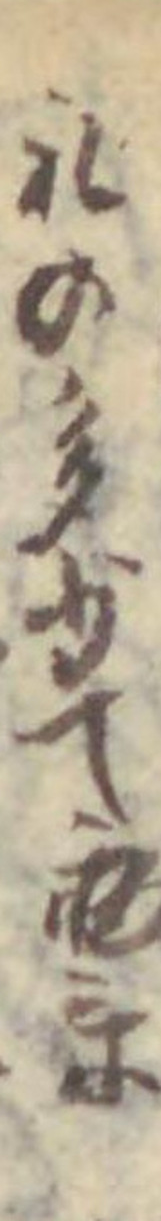礼の多少て病気
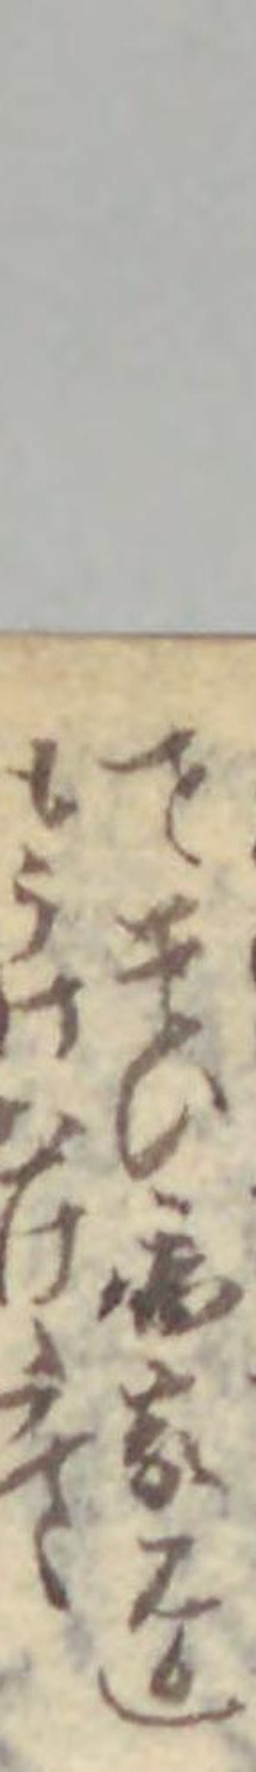もうけむけたてゝ
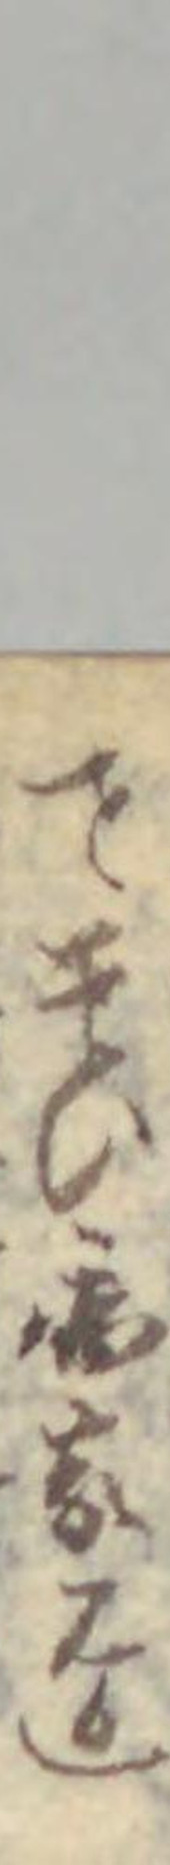を遣ひ病家見廻
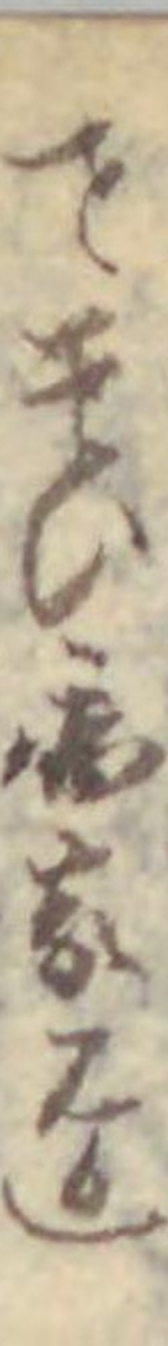を遣ひ病家見廻
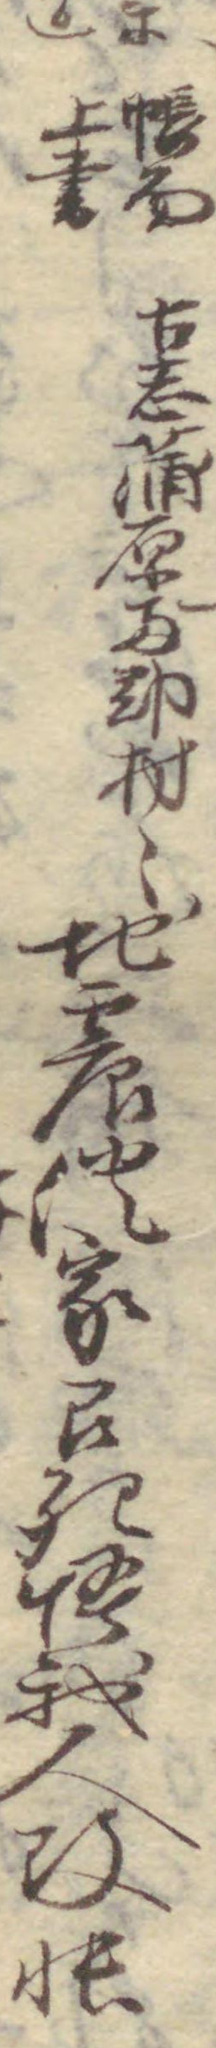帳面古志蒲原両郡村〻地震潰家即死怪我人改帳
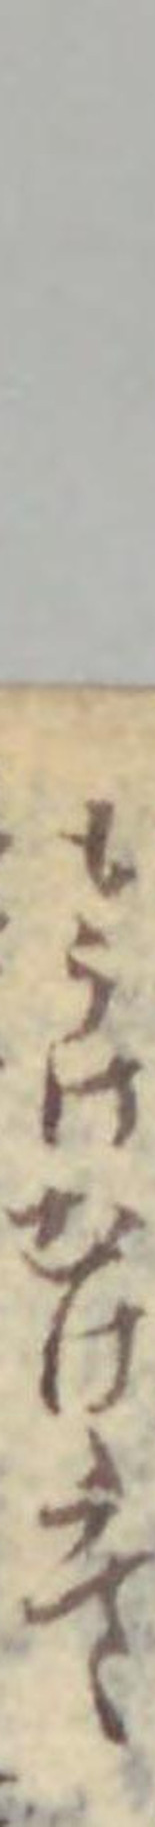もうけむけたてゝ
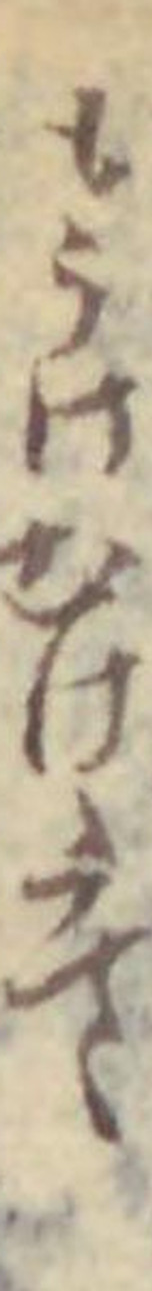もうけむけたてゝ
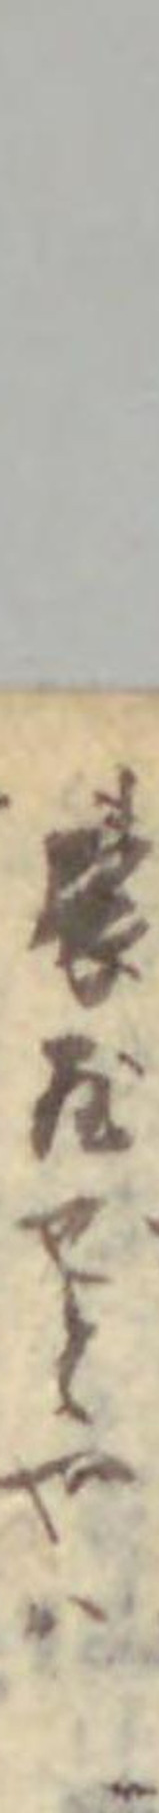裏屋せとやハ
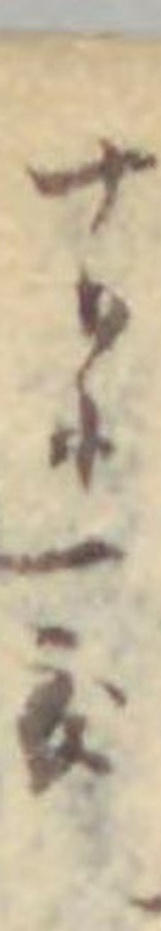十日に一度
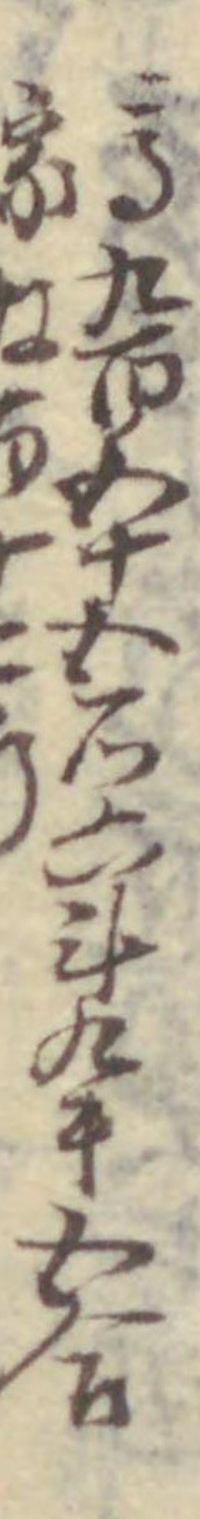高九百五十五石六斗九升五合
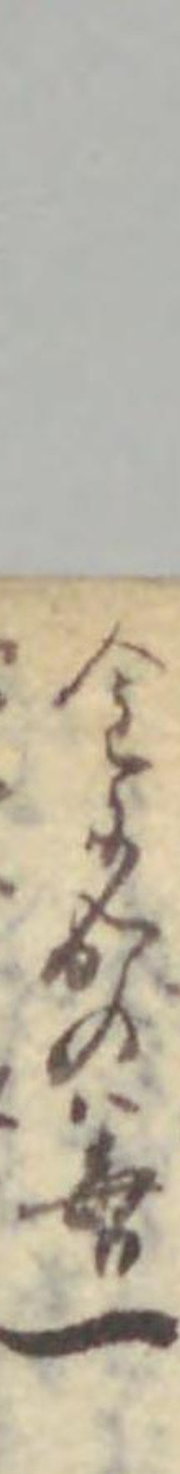金に成のハ毎日
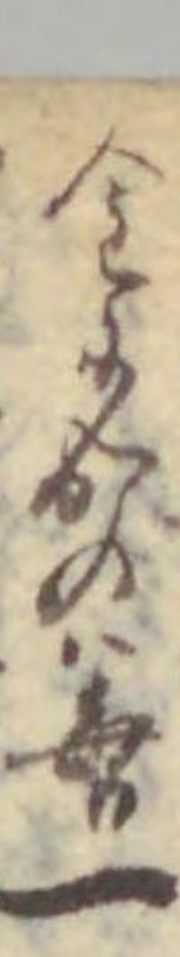金に成のハ毎日
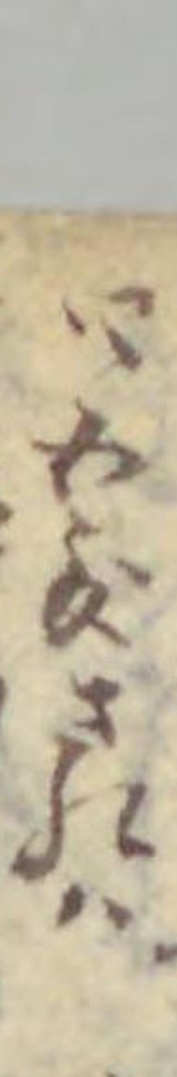四五度されハ
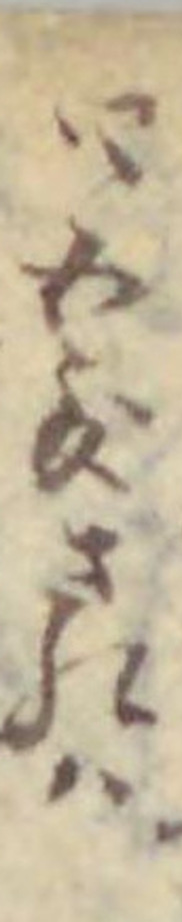四五度されハ
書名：鶯宿雑記. 巻199-200
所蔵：国立国会図書館 National Diet Library, JAPAN
